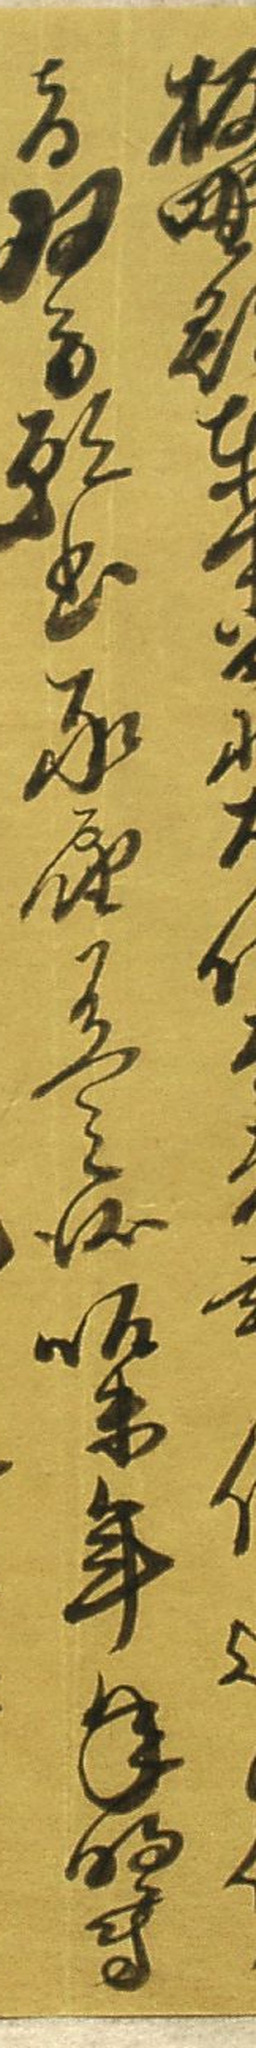旨双方願出承届有之所昨未年年明に付
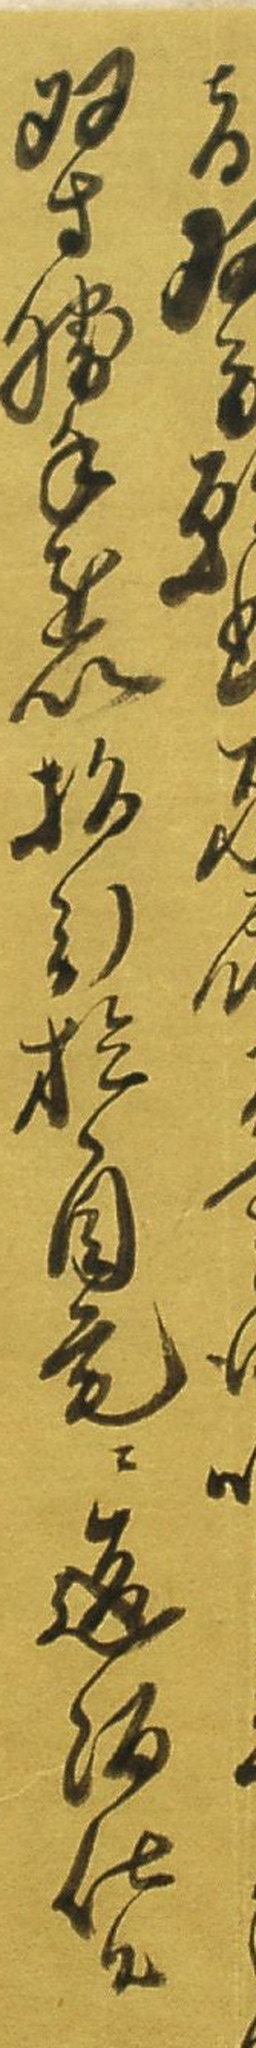双方勝手を以指引於自宅に造酒仕候
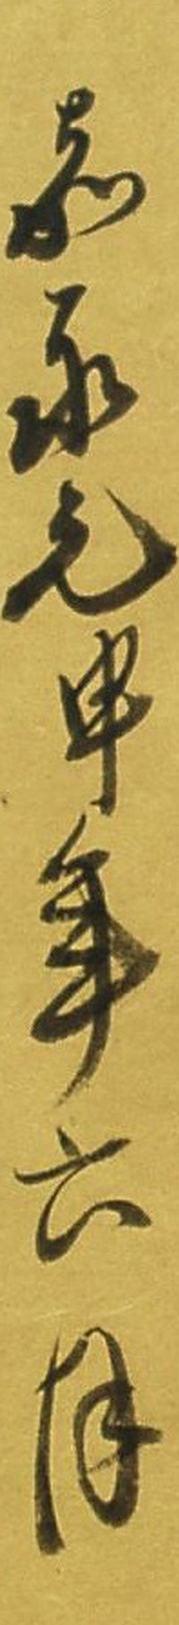嘉永元申年六月
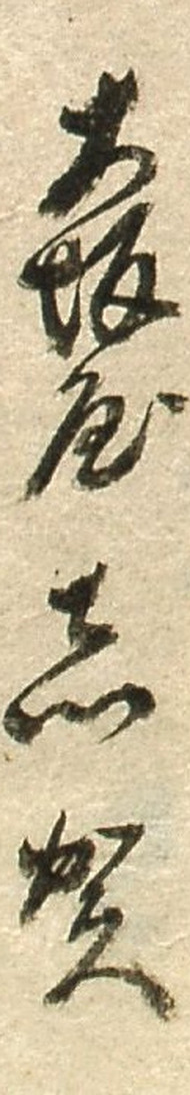大坂屋しか
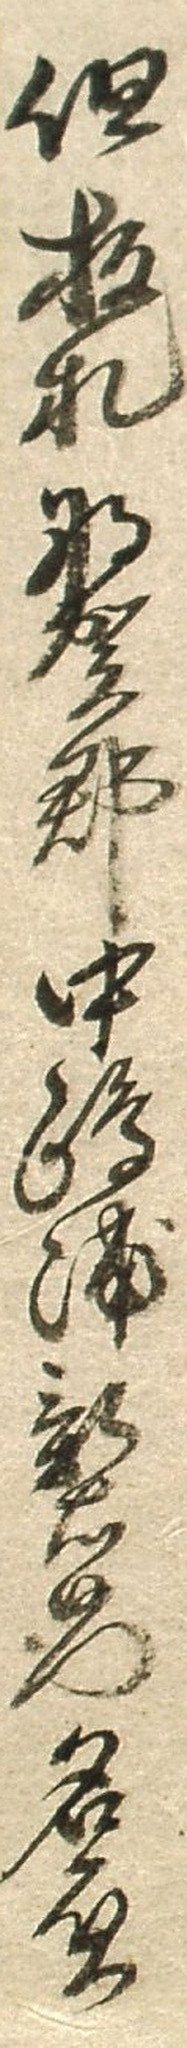但板札那賀郡中嶋浦新右衛門名
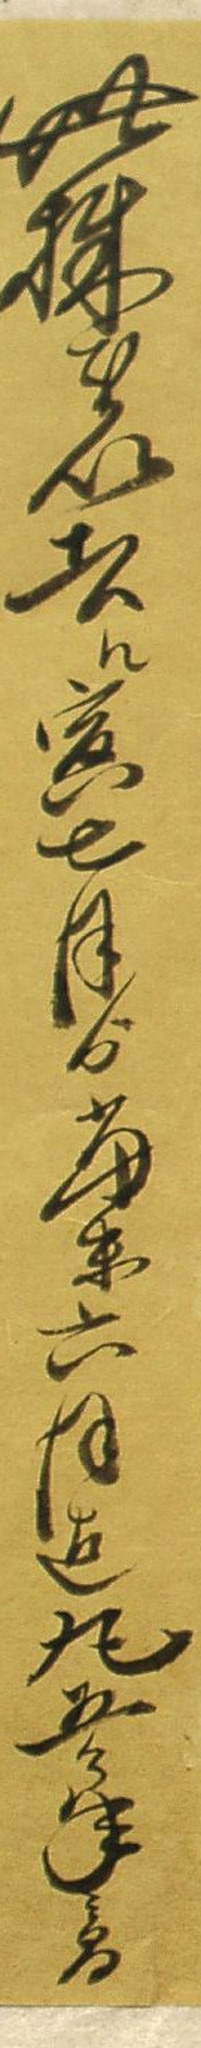此株を以去る寅七月より当未六月迄丸五ヶ年之間
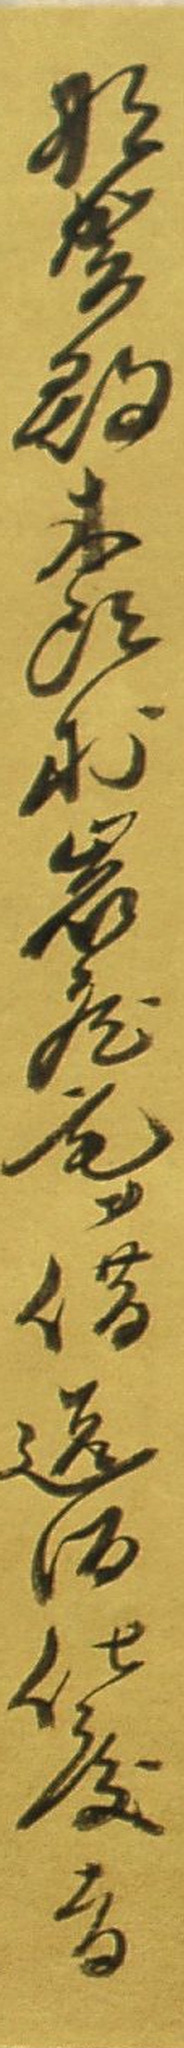那賀郡木頭村岩蔵宅を借造酒仕度旨
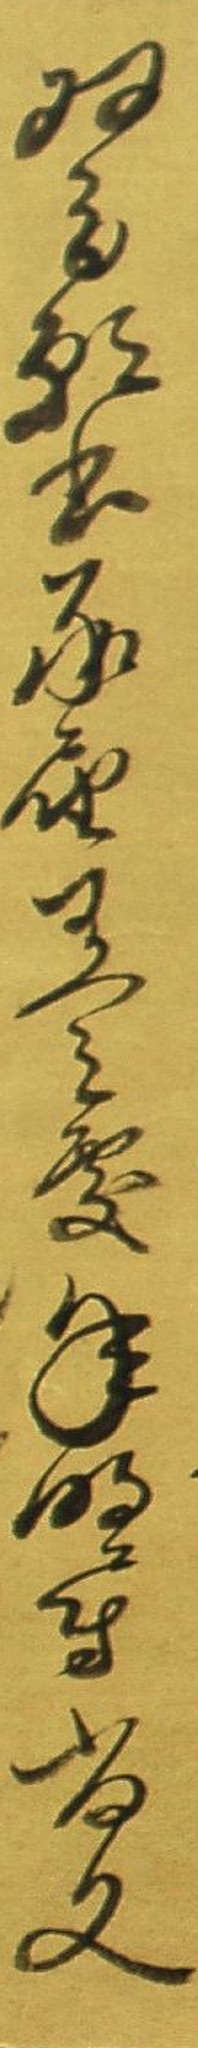双方願出承届有之処年明に付尚又
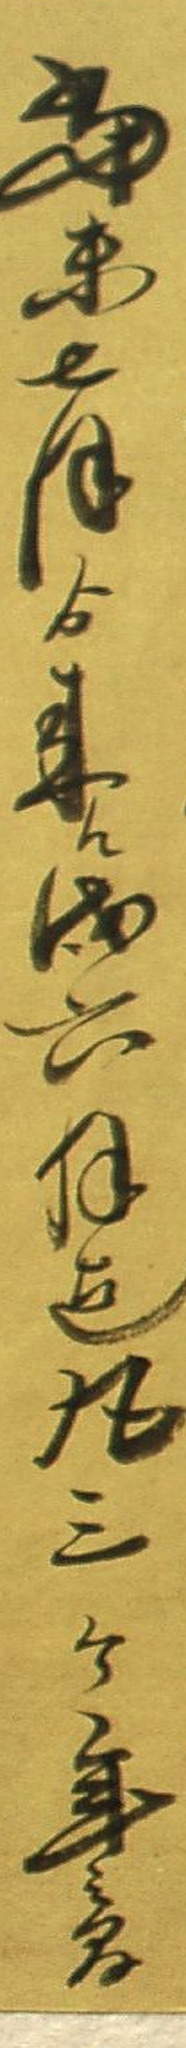当未七月より来る戌六月迄丸三ヶ年之間
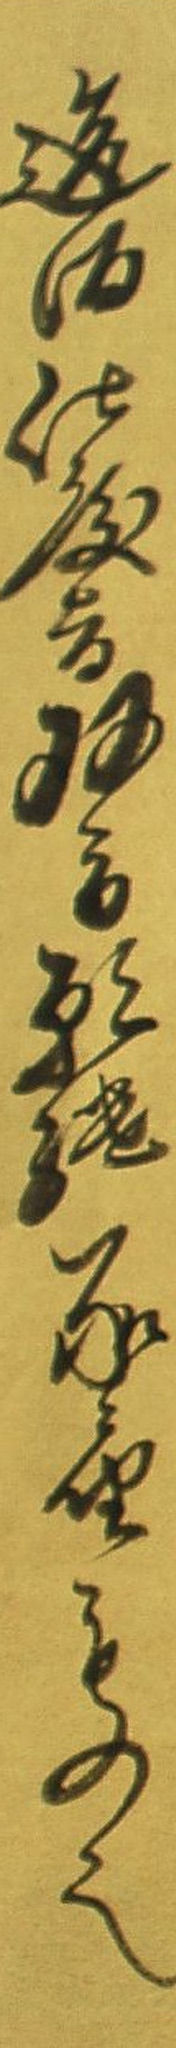造酒仕度旨双方願遣承届もの也
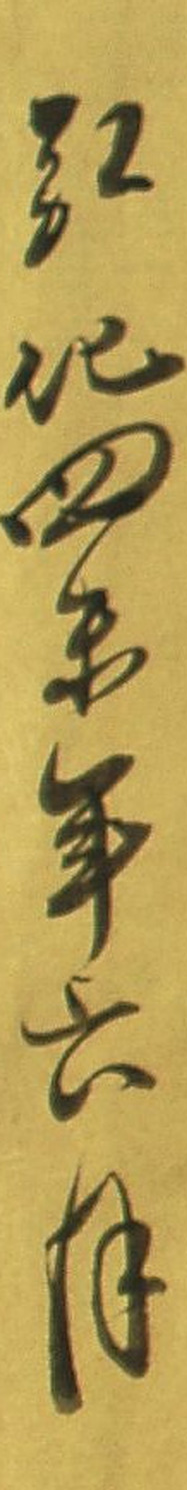弘化四未年六月

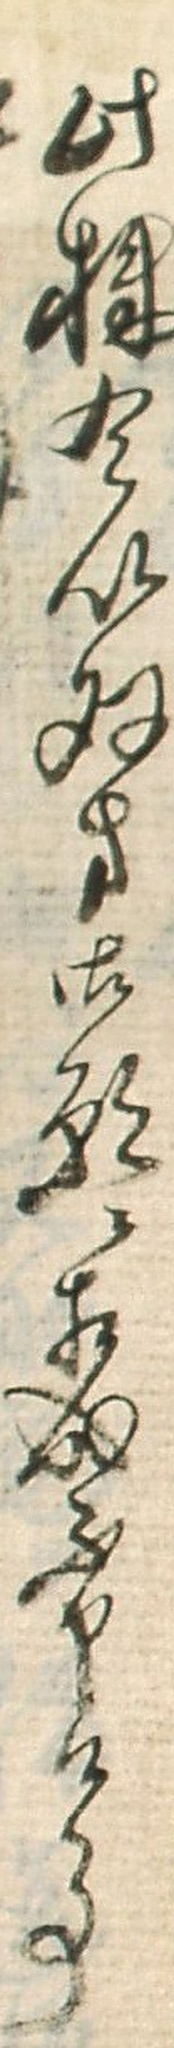此株有以双方御願に相成不申候事
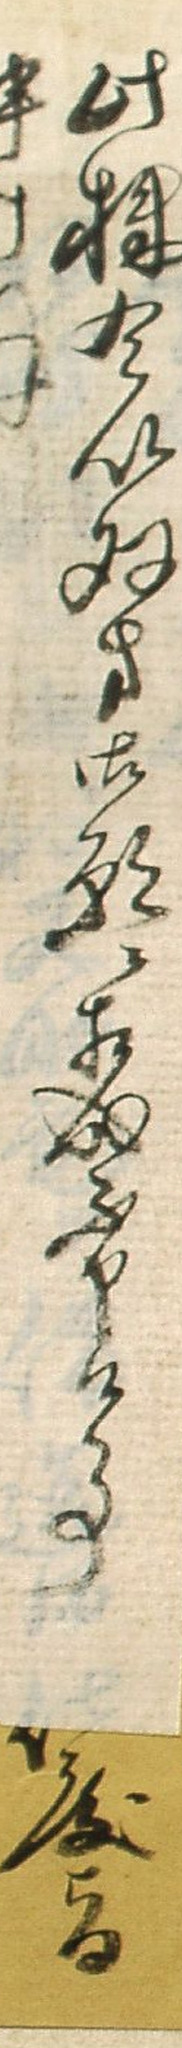此株有以双方御願に相成不申候事

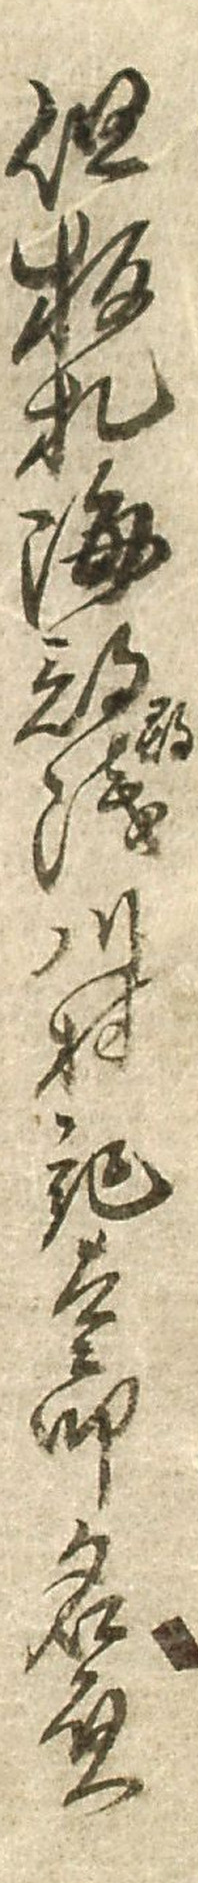但板札海部郡浅川村太郎名
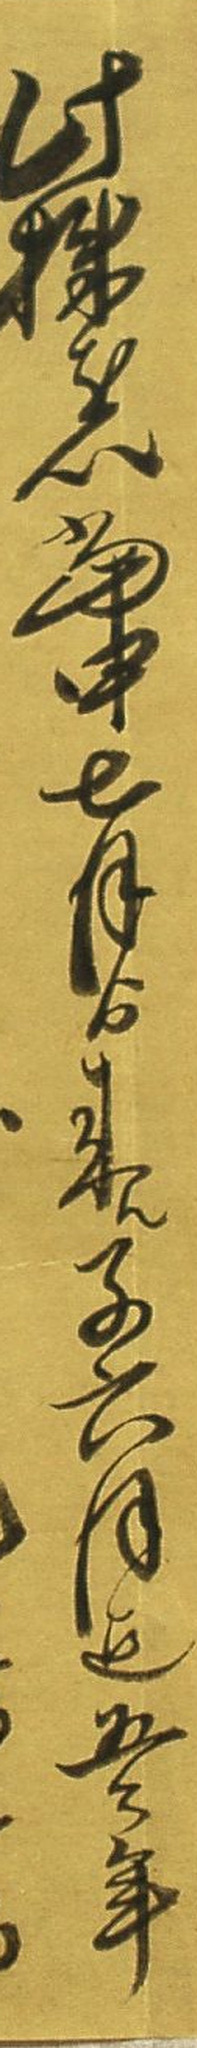此株を以去る当申七月より来る子六月迄丸ヶ年
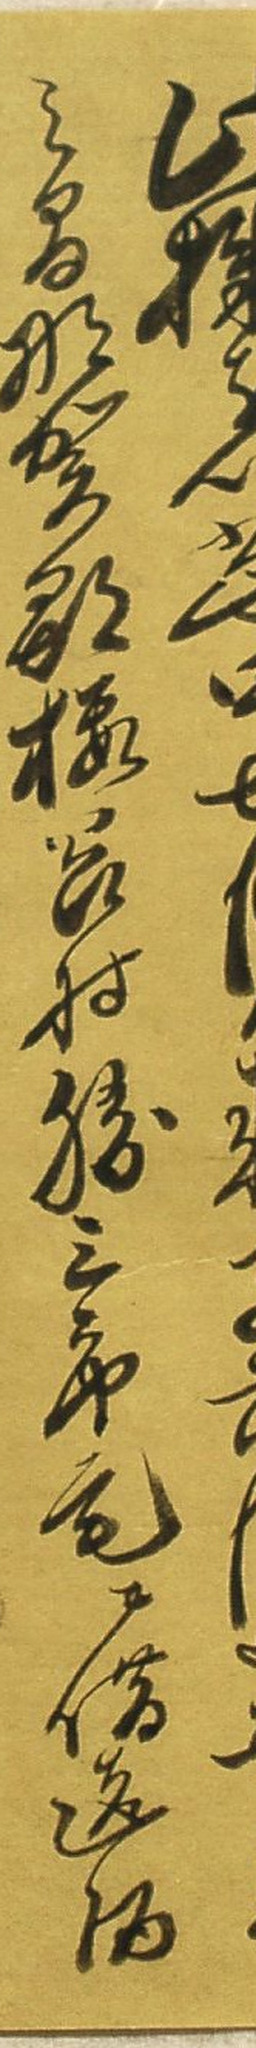之間那賀郡桜谷村勝三郎宅を借造酒
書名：名東郡中酒株並造酒屋軒数取調帳
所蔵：鳴門教育大学 Naruto University of Education
